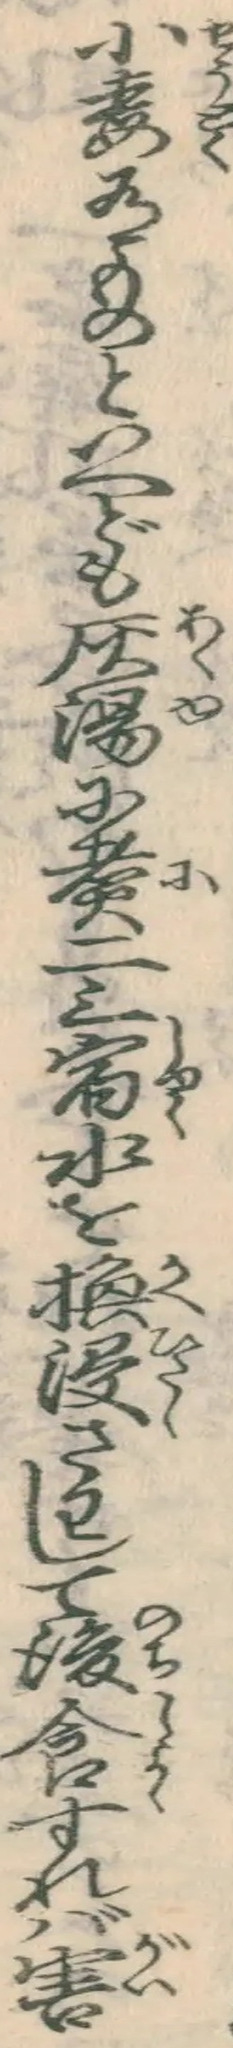小毒有ものといへども灰湯に煑二三宿水を換浸さわして後食すれば害
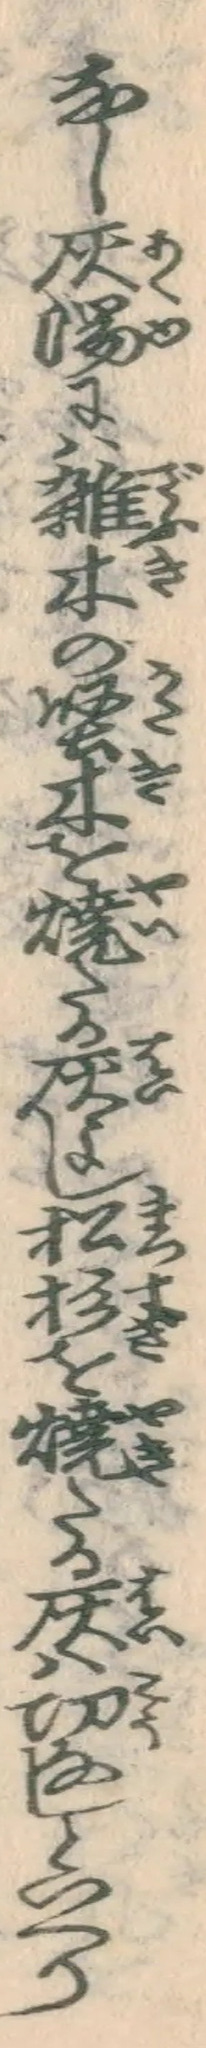なし灰湯には雑木の堅木を焼たる灰よし松杉を焼たる灰は功なしといへり
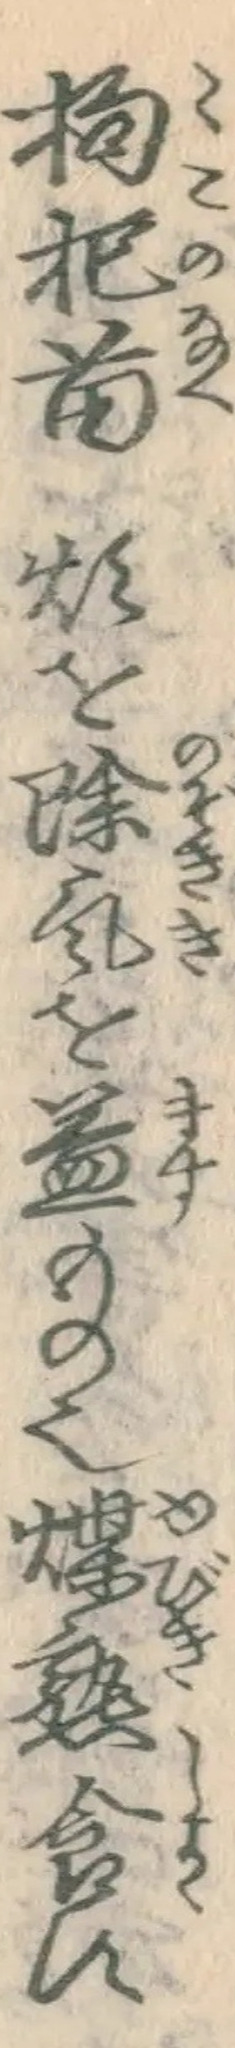枸杞苗煩を除気を益もの也煠熟食す
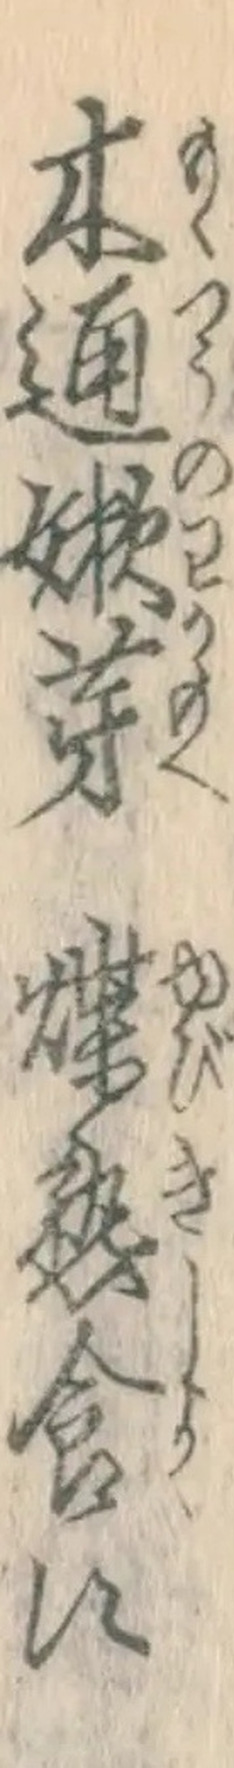木通嫰芽煠熟食す
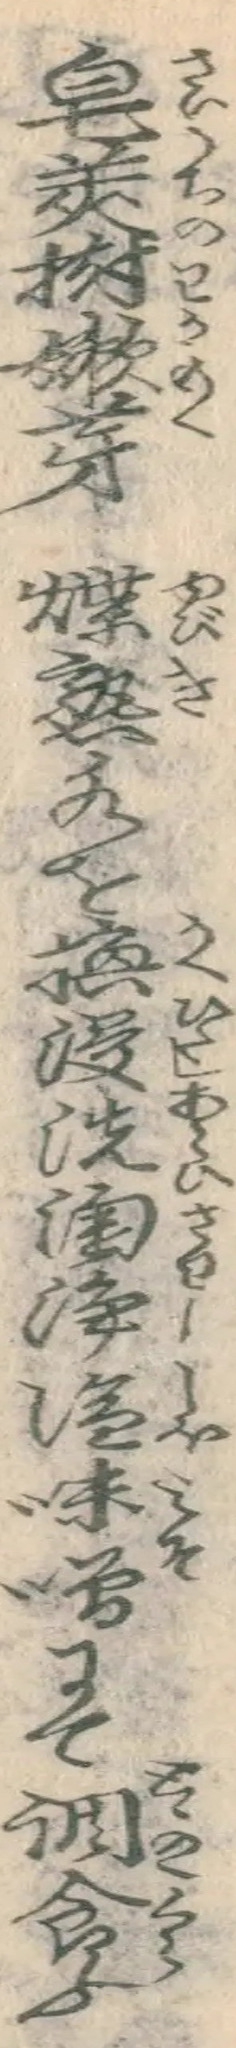皂莢樹嫰芽煠熟水を換浸洗淘浄塩味噌にて調食ふ
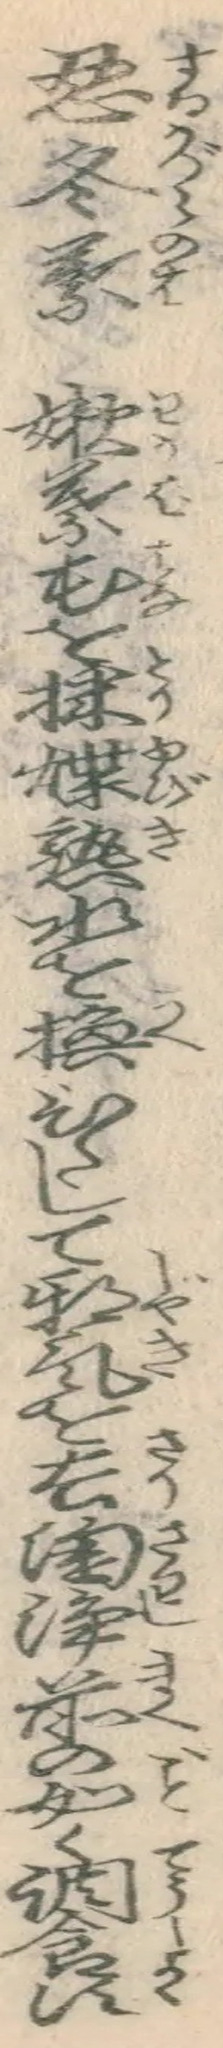忍冬葉嫰葉花を採煠熟水を換ひたして邪気を去淘浄前の如く調食す
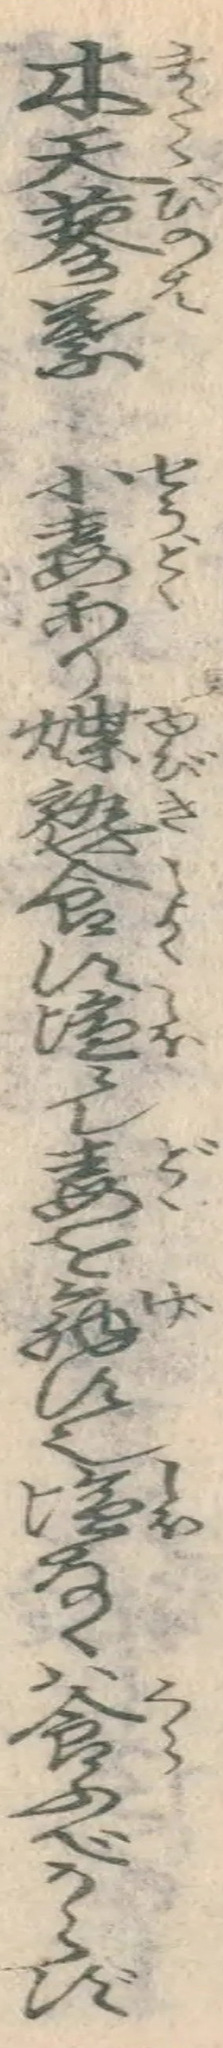木天蓼葉小毒あり煠熟食す塩にて毒を解す也塩なくは食ふべからず
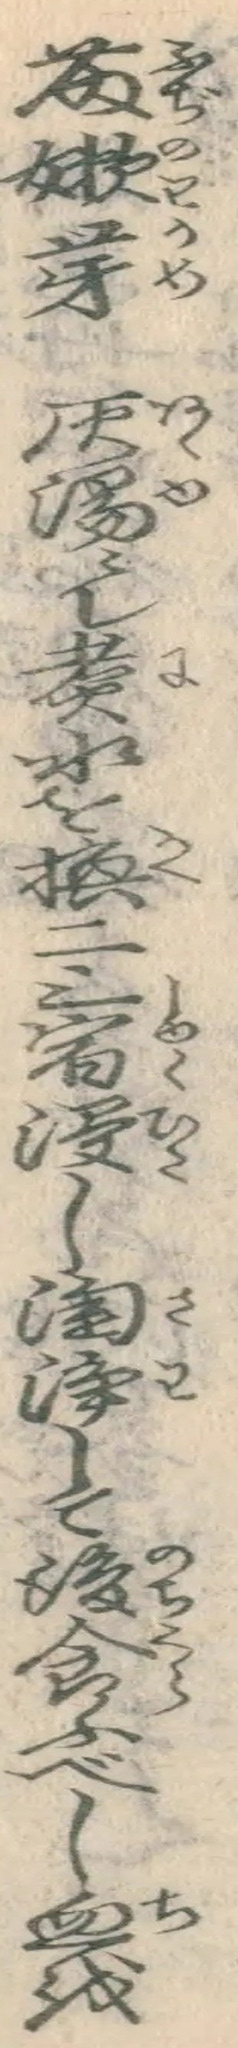藤嫰芽灰湯にて煑水を換二三宿浸し淘浄して後食ふべし血を
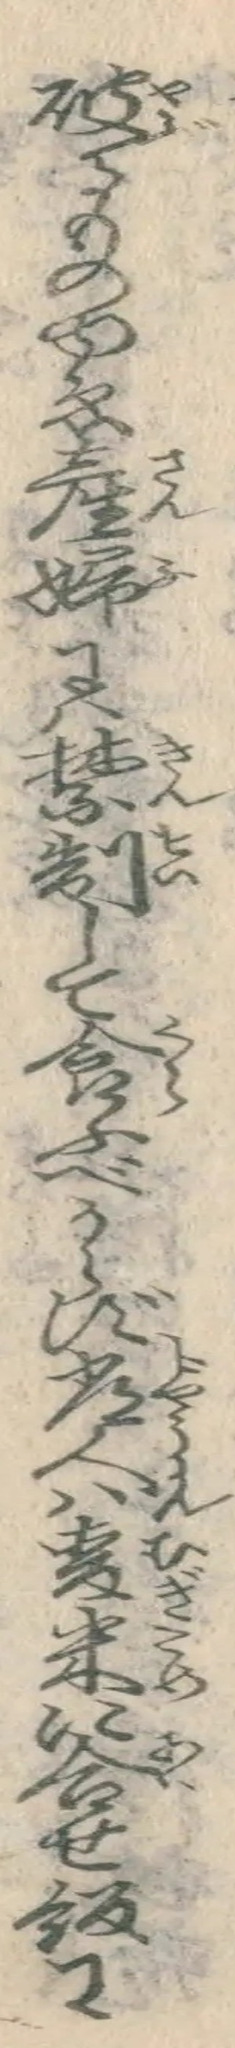破るものゆゑ産婦には禁制して食ふべからず常人は麦米に合せ飯に
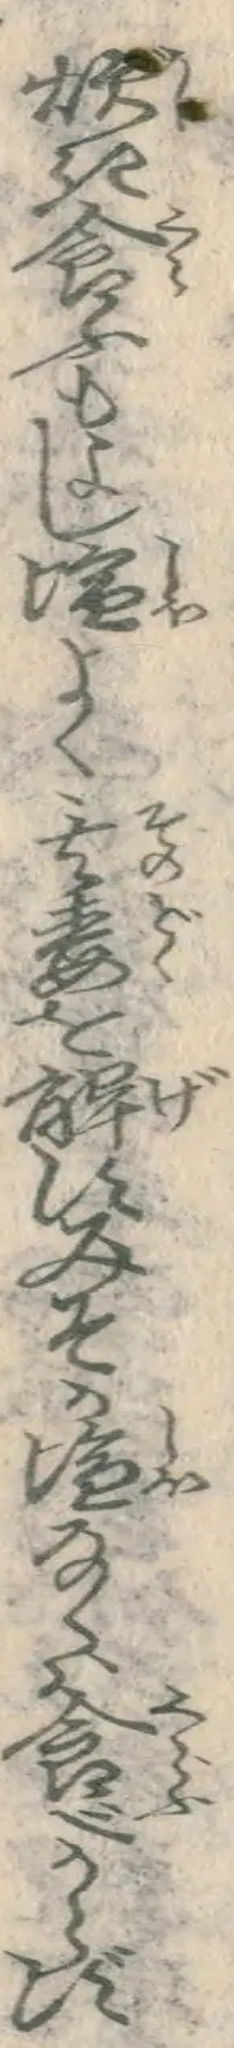炊き食ふもよし塩よく其毒を解すみそか塩なくは食べからず
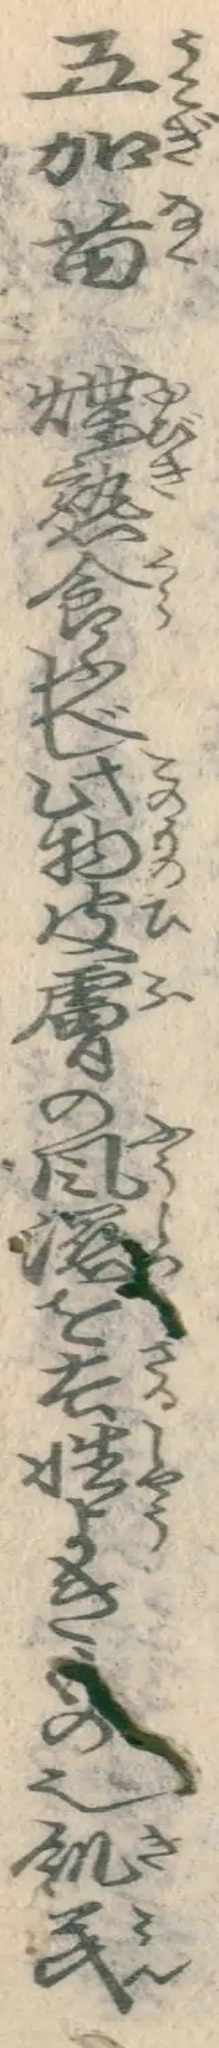五加苗煠熟食ふべし此物皮膚の風湿を去性よきもの也飢民

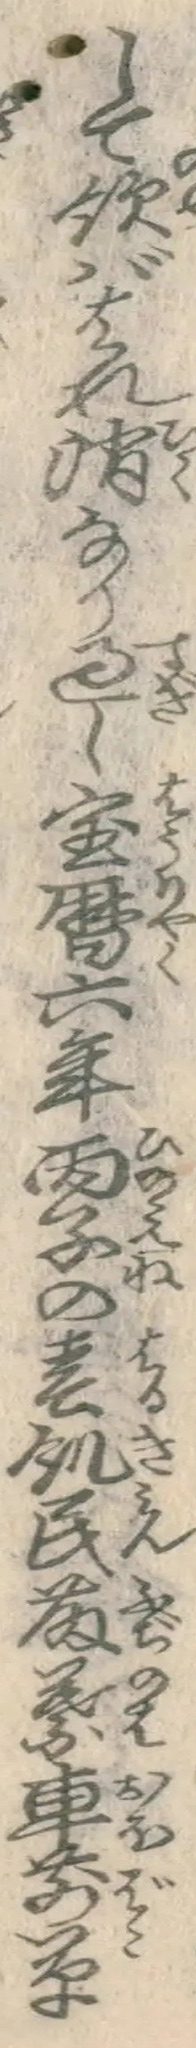して飲ばはれ消なり過し宝暦六年丙子の春飢民藤葉車前草
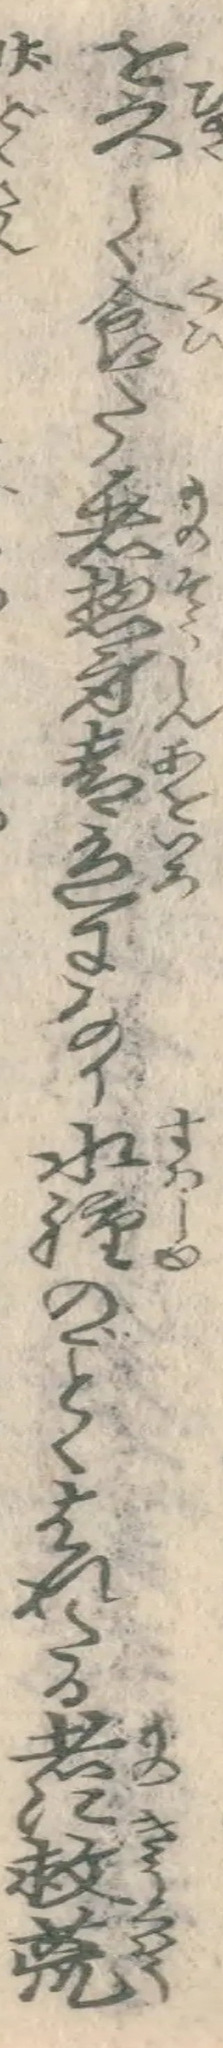を久しく食たる者惣身青色になり水腫のごとくはれたる者に救荒
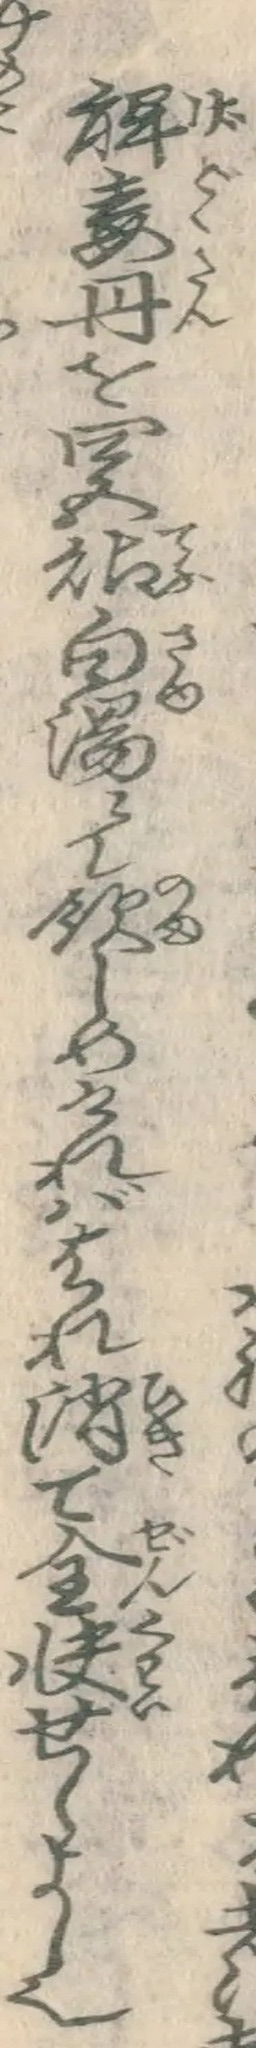解毒丹を四五貼白湯にて飲しめければはれ消て全快せしよし也
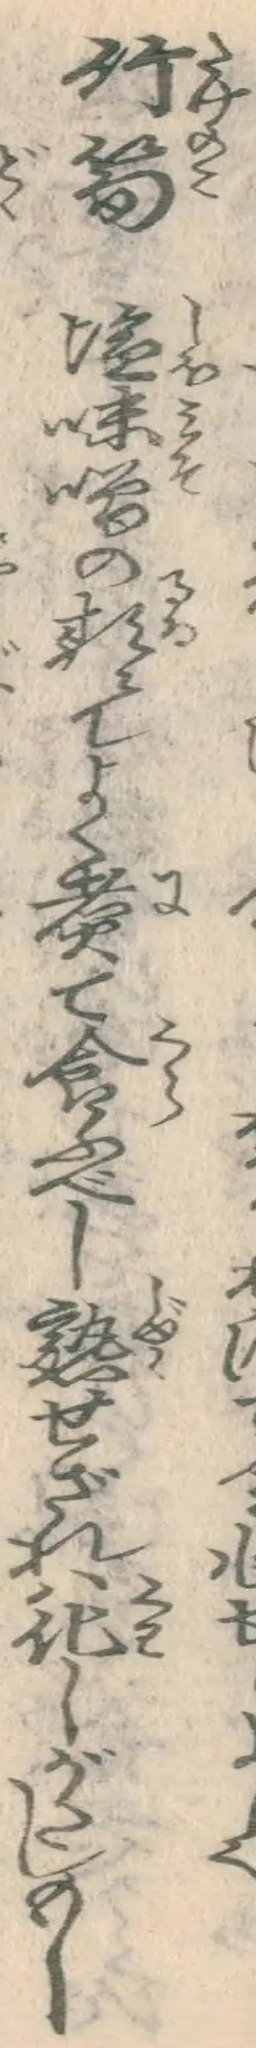竹筍塩味噌の類にてよく煑て食ふべし熟せざれは化しがたしもし
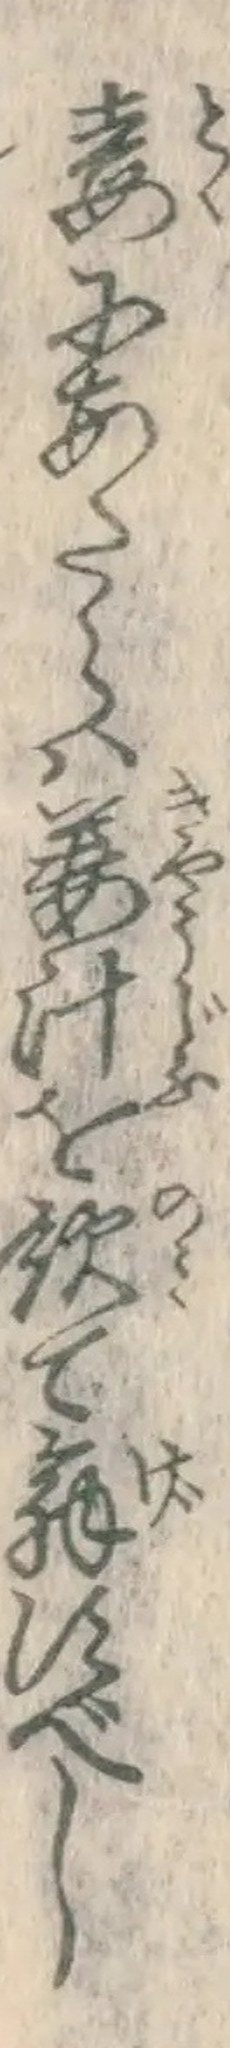毒にあたらは姜汁を飲て解すべし
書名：経済をしへ草
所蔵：国立国会図書館 National Diet Library, JAPAN
